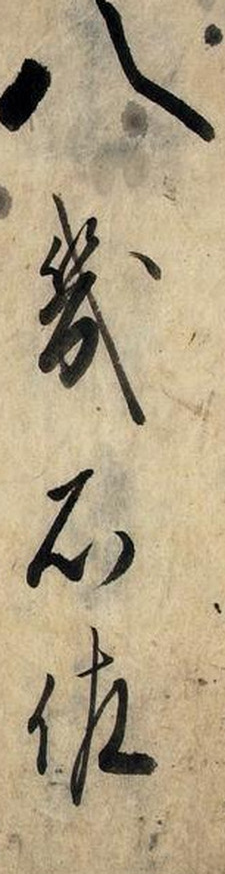八幾石佐
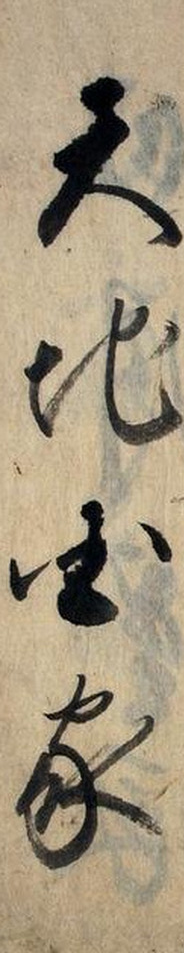天地国家

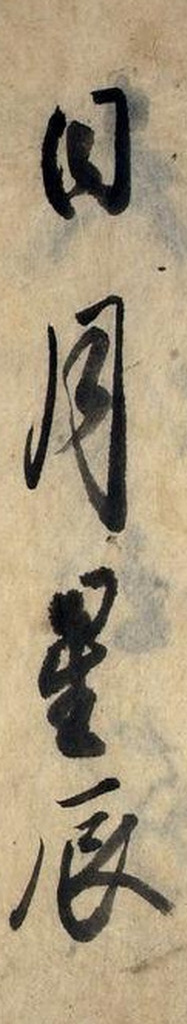日月星辰
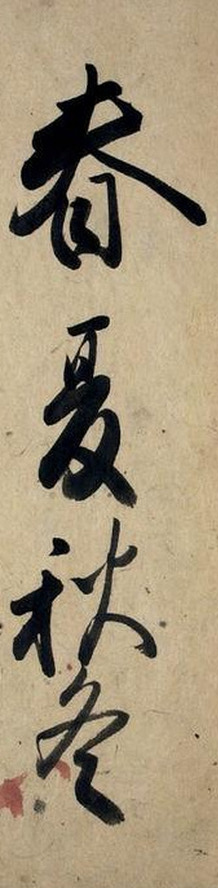春夏秋冬

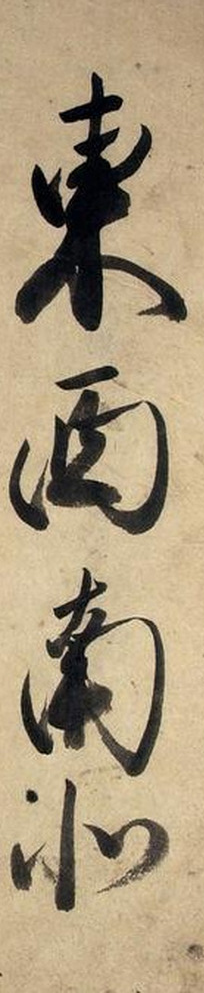東西南北
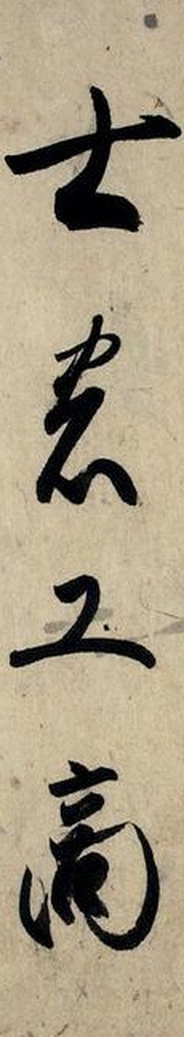士農工商

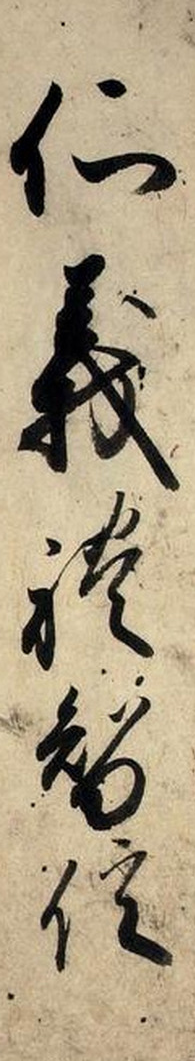仁義礼智信
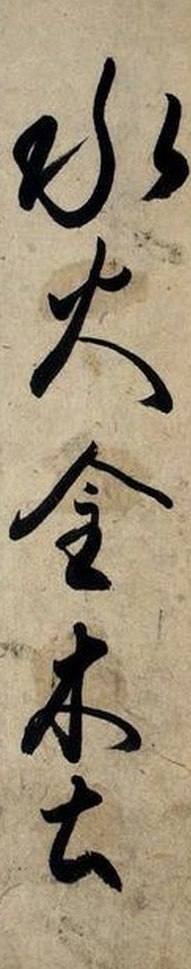水火金木土
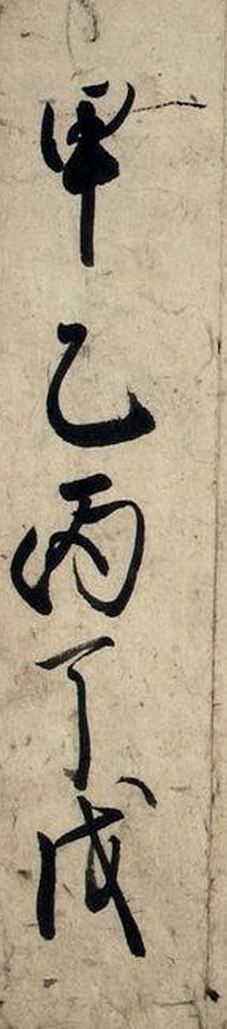甲乙丙丁戊

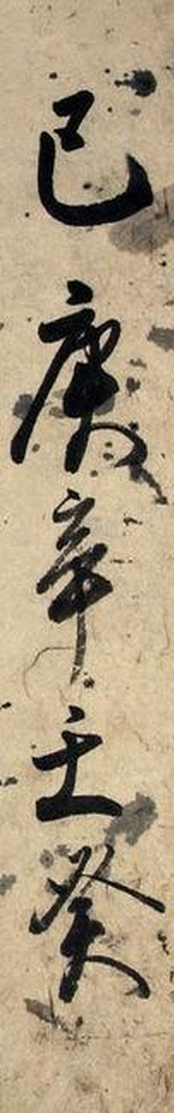己庚辛壬癸
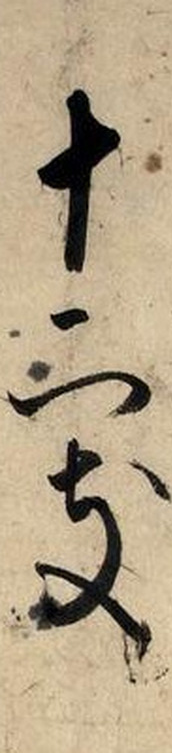十二支
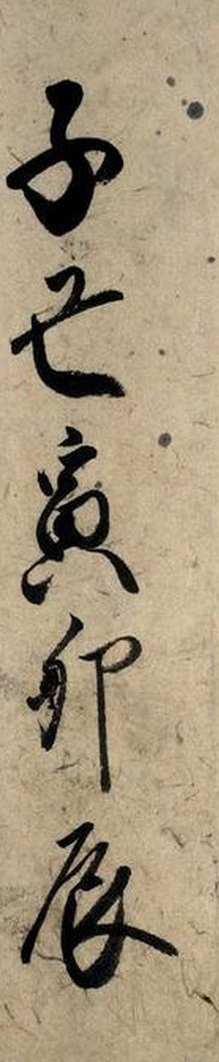子丑寅卯辰
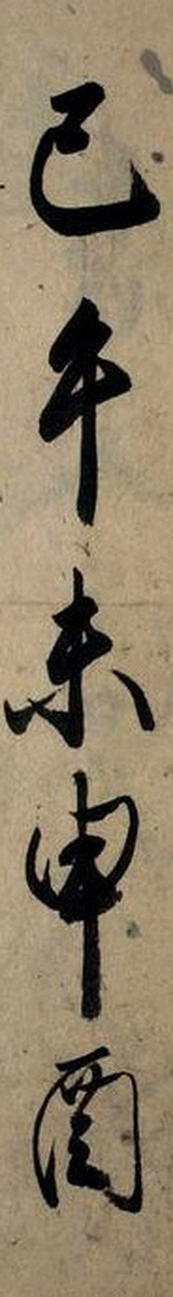巳午未申酉
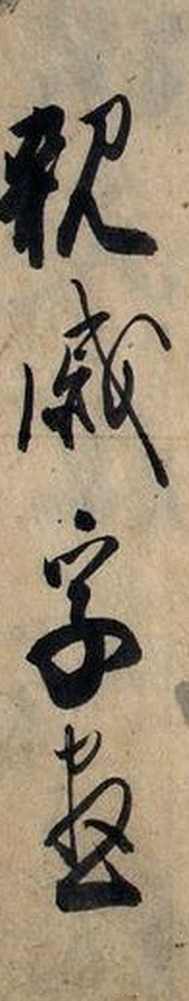親戚字尽

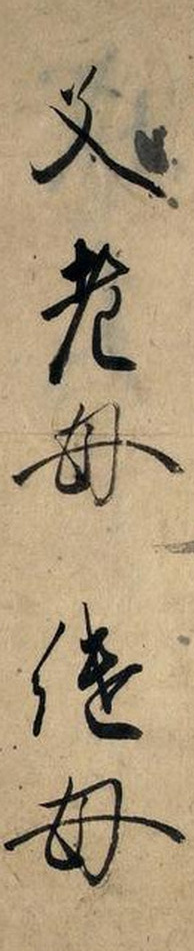父老母継母
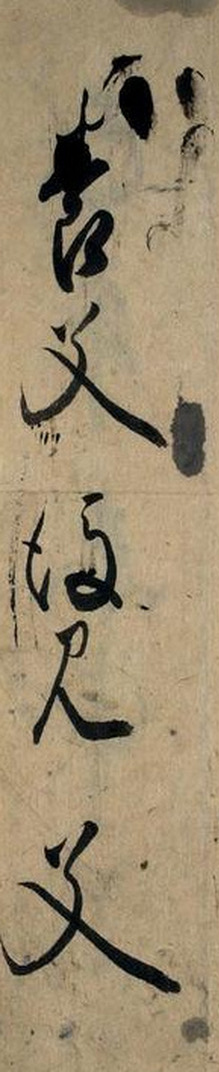養父後見父
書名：御手本（手習、いろは・数字、「名頭之事」「親戚字尽」「相庭之…
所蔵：福井県文書館 Fukui Prefectural Archives
